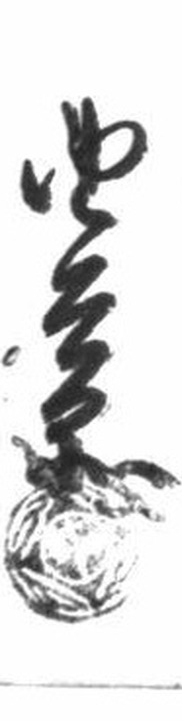七兵衛
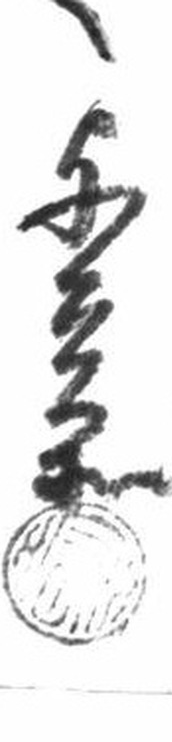与兵衛
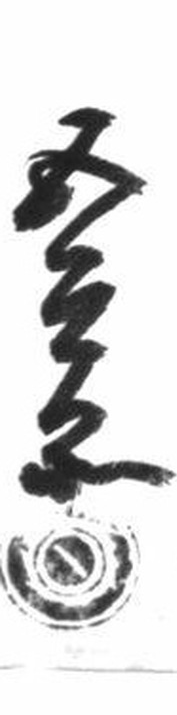五兵衛
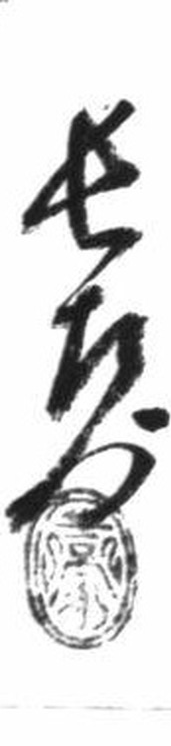長左衛門
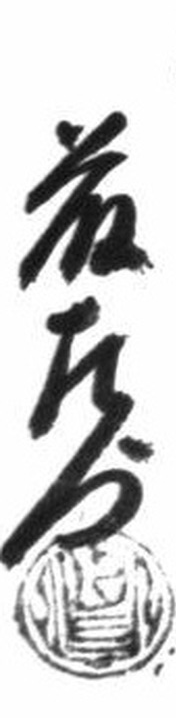藤左衛門
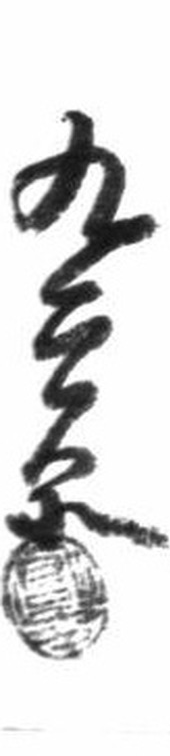九兵衛
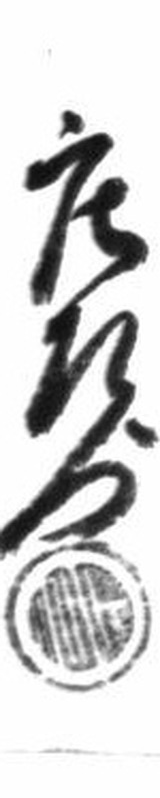庄左衛門
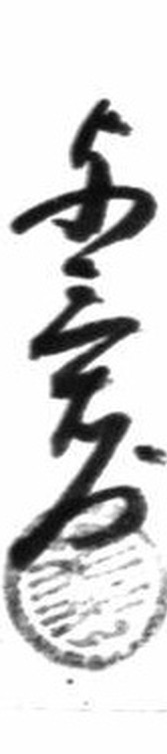与三右衛門
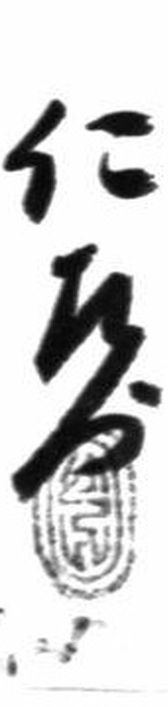仁左衛門
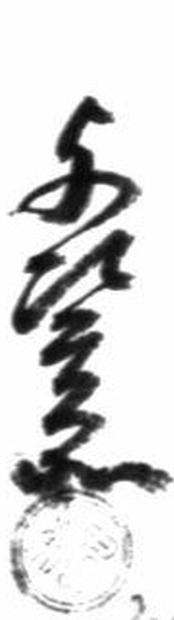与次兵衛
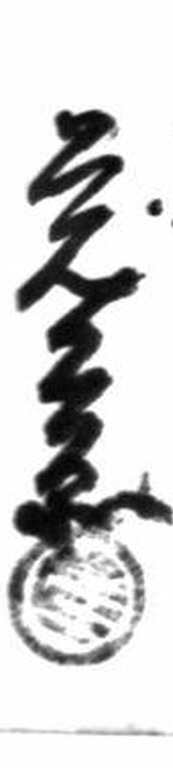覚兵衛

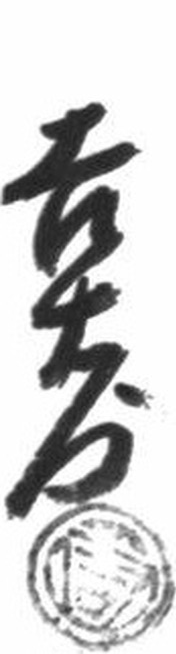吉右衛門
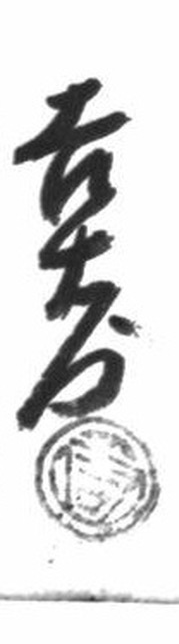吉右衛門
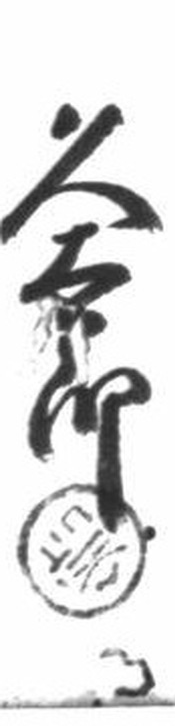久太郎
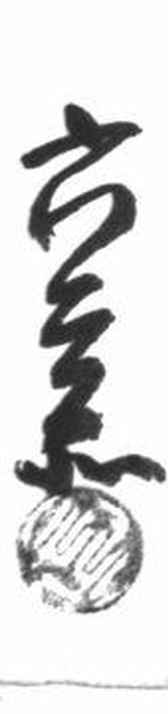六兵衛
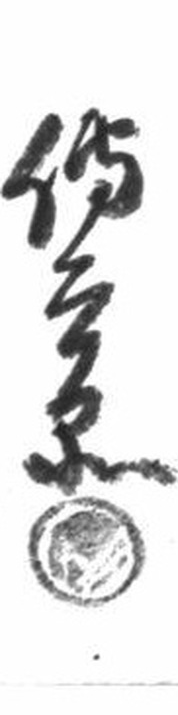徳兵衛
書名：宝永弐酉五月火之用心護摩之灰御改帳証文
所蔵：福井県文書館 Fukui Prefectural Archives
